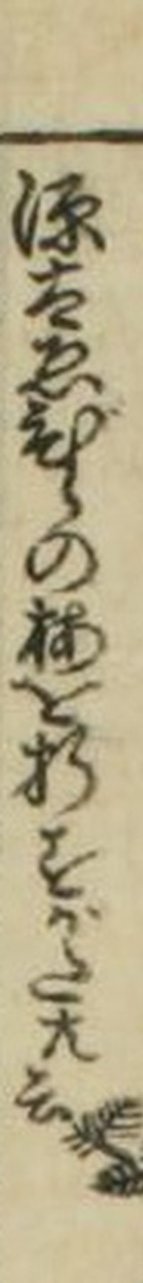源太ゑびらの梅を折すがた共云
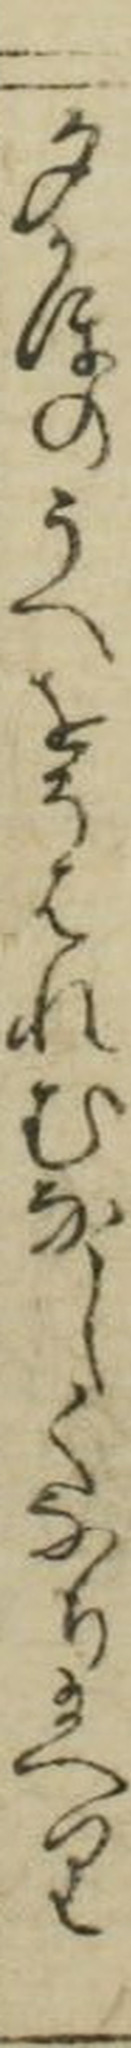夕かほのうへをそはれむなしくなり給へり
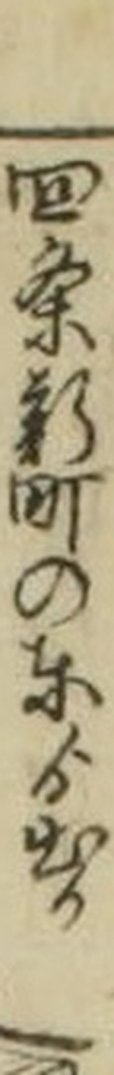四条新町の東より出る
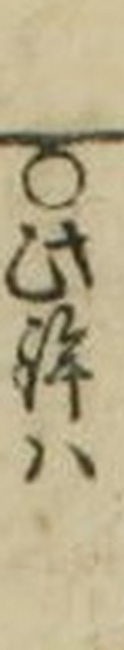○此鉾は
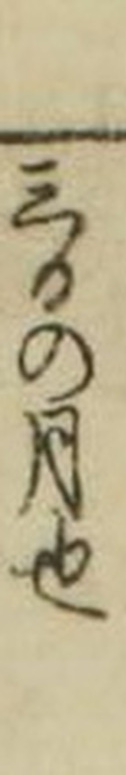三日の月也
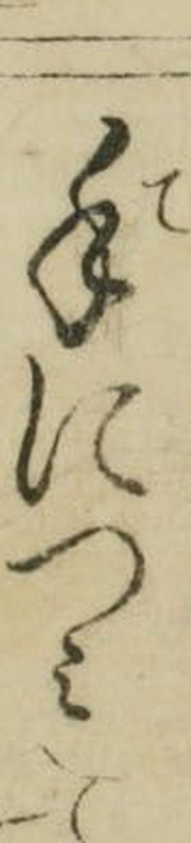手につみ
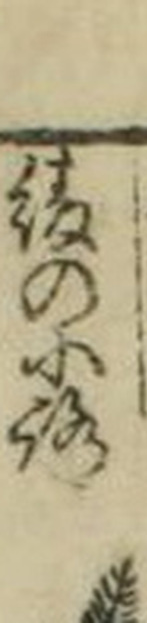綾の小路
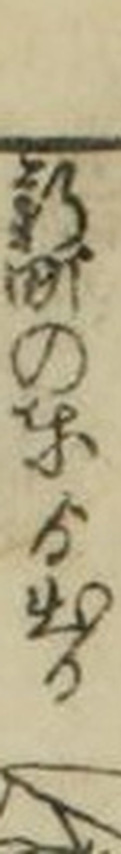新町の東より出る
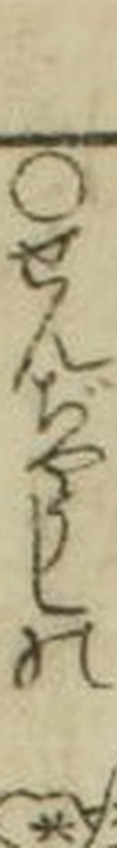○せんぢやうしの
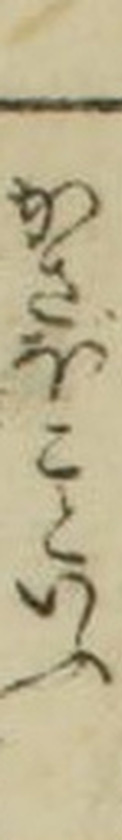かさぼこといふ
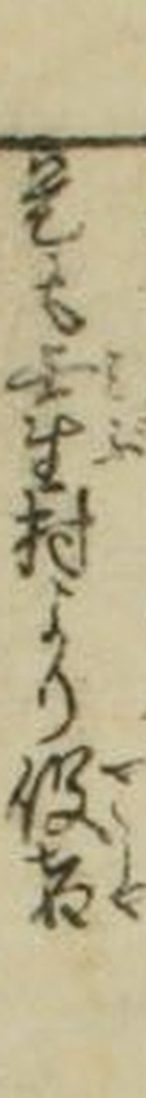是も壬生村より役者
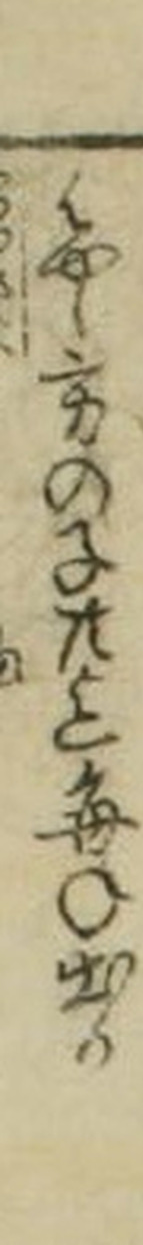はやし方の子共迄毎年出る
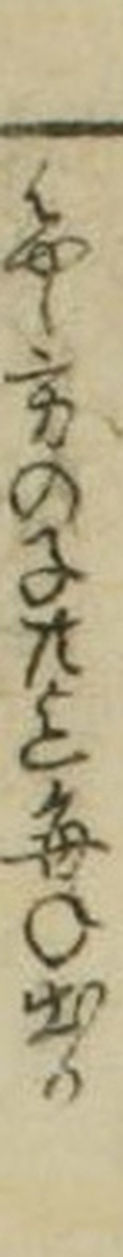はやし方の子共迄毎年出る
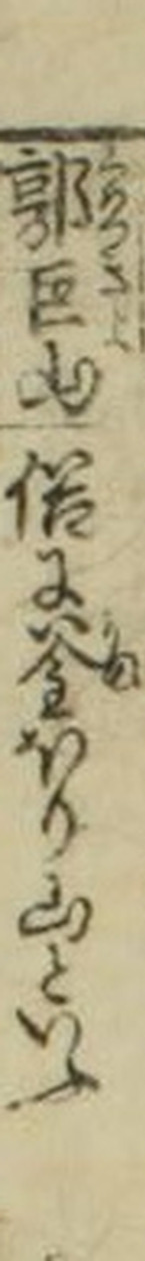郭巨山俗に釜ほり山といふ
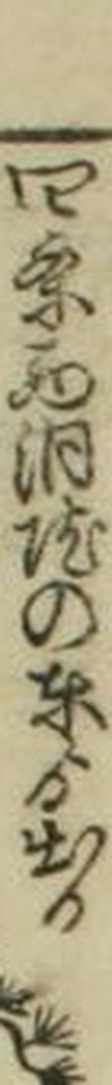四条西洞院の東より出る
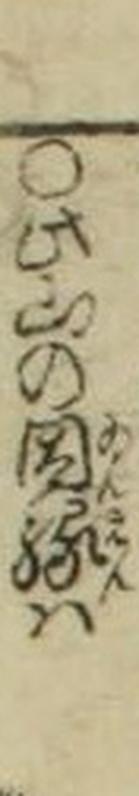○此山の因縁は
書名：女源氏教訓鑑
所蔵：東京学芸大学附属図書館
